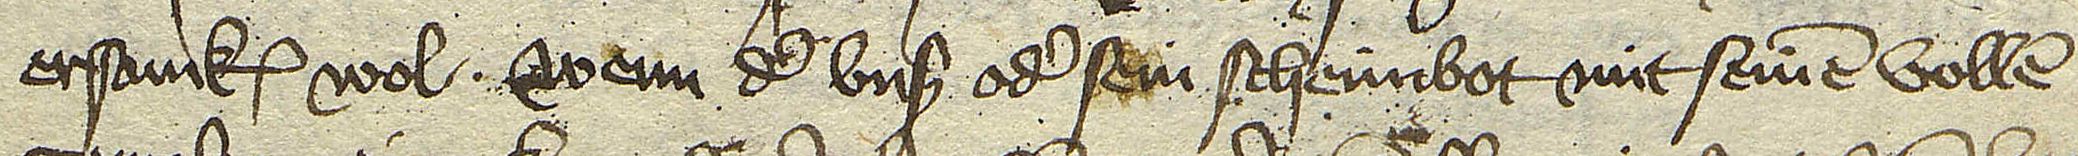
erſamk* wol . wenn d* vnſ* od* ſein ſcheinbot mit ſeine* volle*
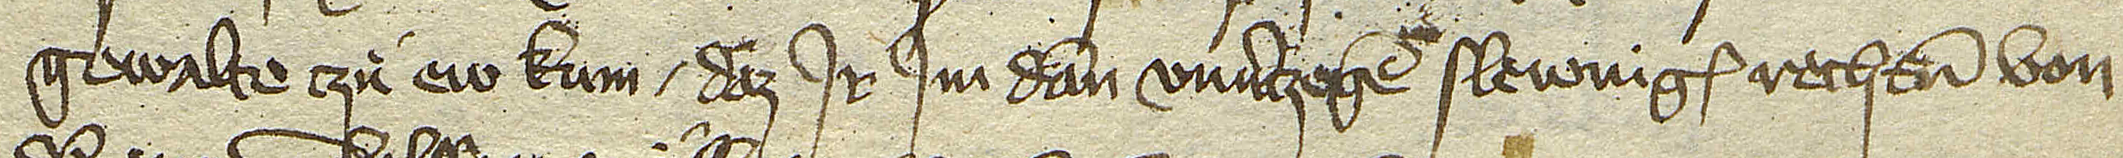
gewalte cʒü ew kum / daʒ Ir Im dan* vnu*cʒoge* ſlewnig* rechtn* von
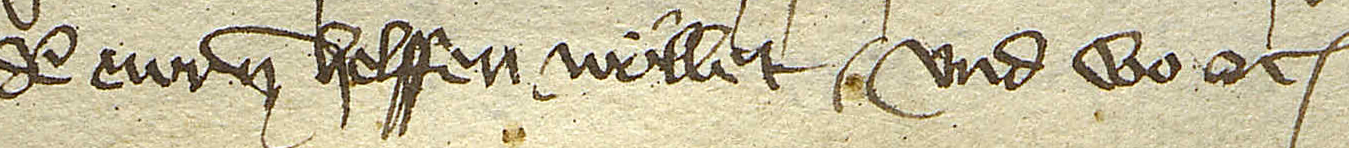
d* ewrn* helffen wöllet / vnd wo ec*
